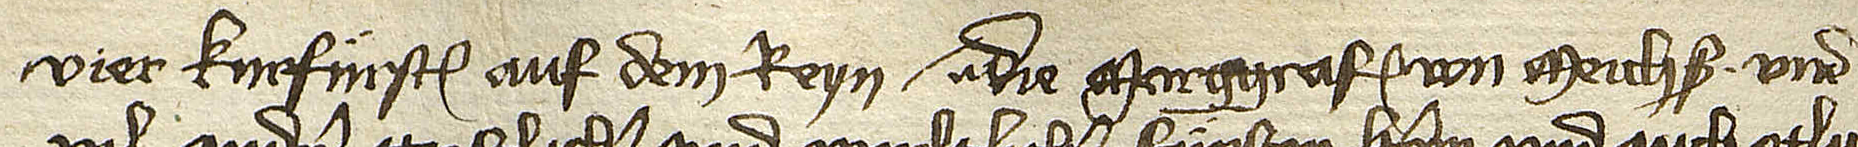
vier kurfürſt* auf dem Reyn / ~ die Marggraf* von Meichſ* . vnd
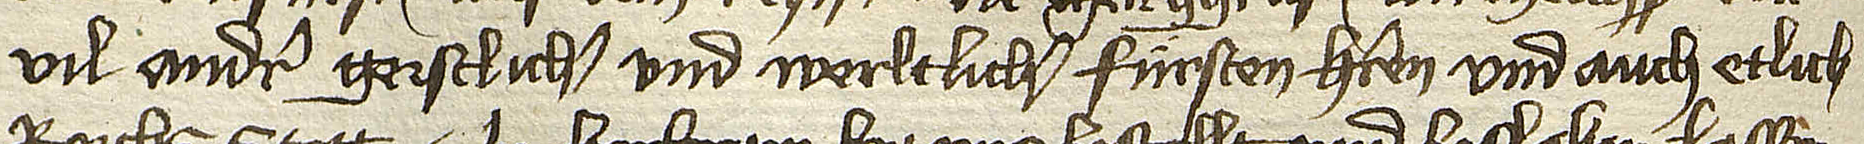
vil andr* geiſtlich* vnd werltlich* fürſten hr*en vnd auch etlich
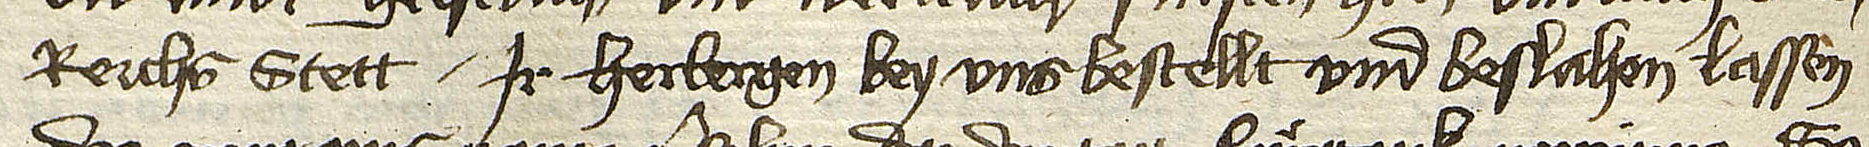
Reichs Stett / Ir herbergen bey vns beſtellt vnd beſlahen laſſen
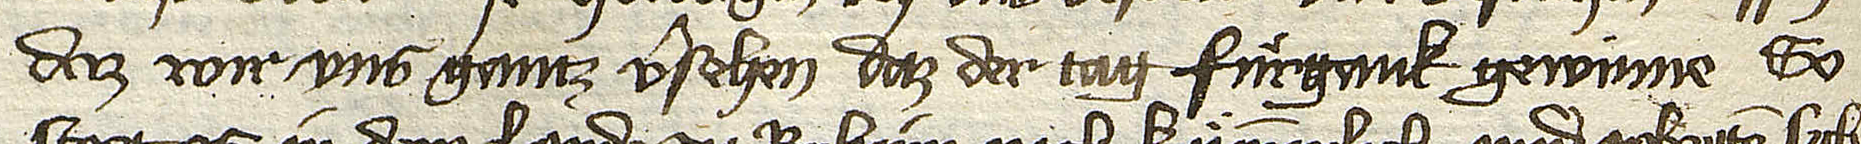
daʒ wir vns gancʒ v*ſehen daʒ der tag fürgank gewinne So
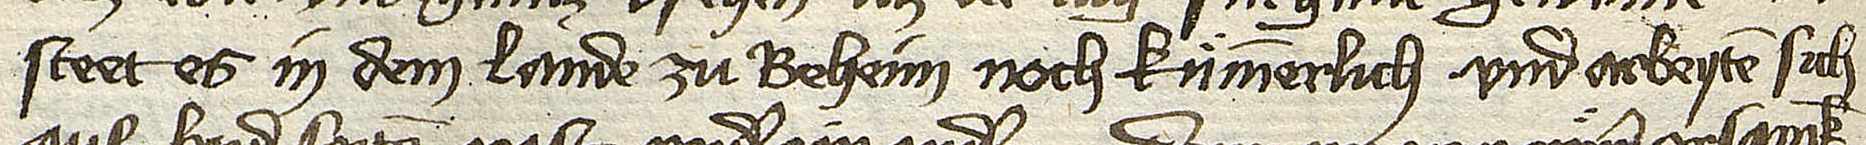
ſteet es in dem lande ʒu Beheim noch küm*erlich vnd arbeyte* ſich
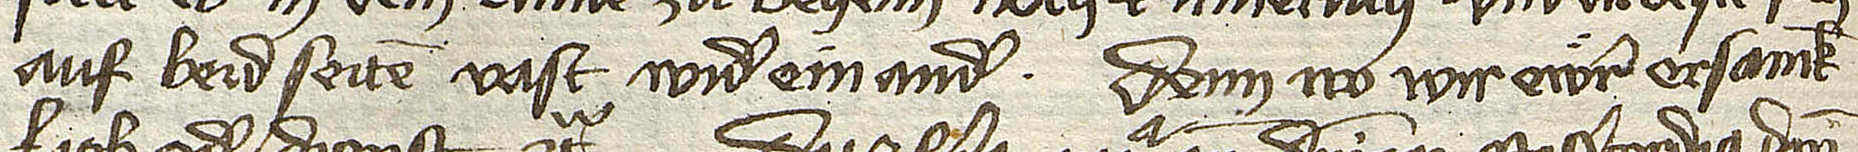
auf beid ſeite* vaſt wid* ein and* . Denn wo wir eẅr* erſamk*
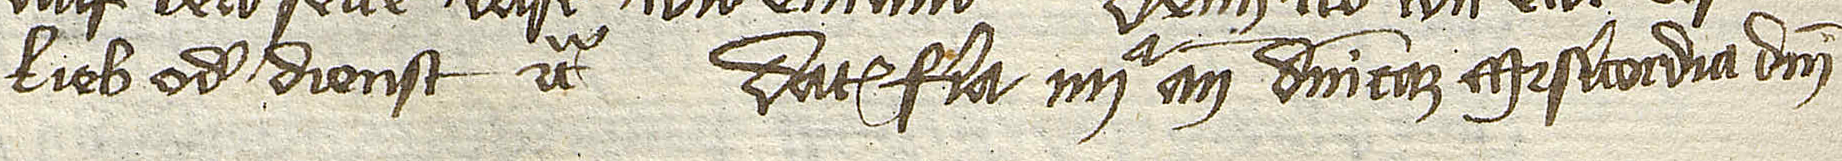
lieb od* dienſt ec* Dat* f*ia iiii* an* dnica* Miſ*icordia dni*
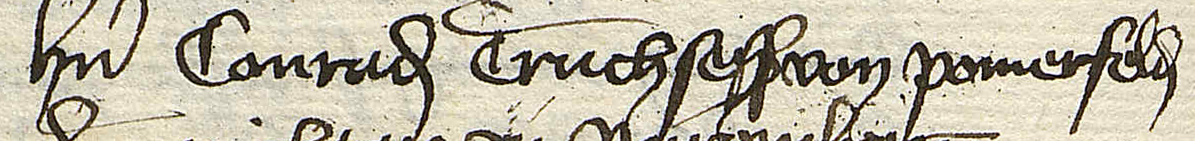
hn* Conrad* Truchſeſſ* von pomerfeld*
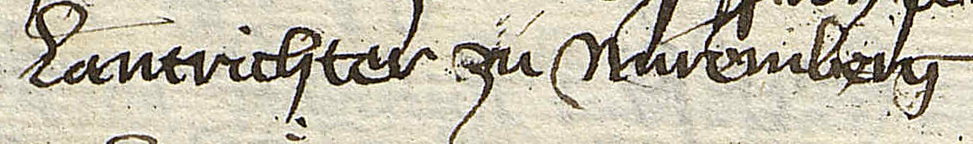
Lantrichter cʒu Nuremberg
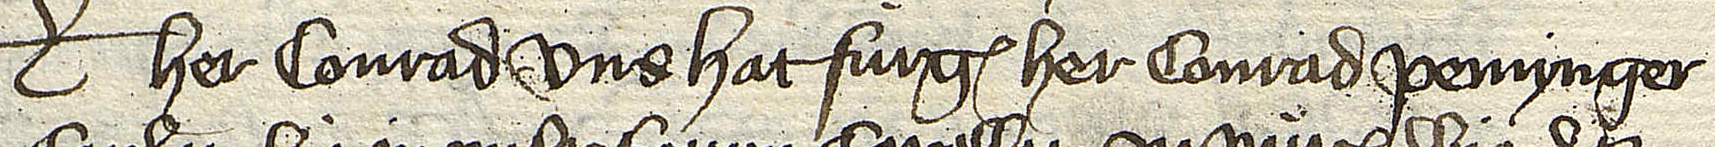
L* her Conrad vns hat fürg* her Conrad Peinynger
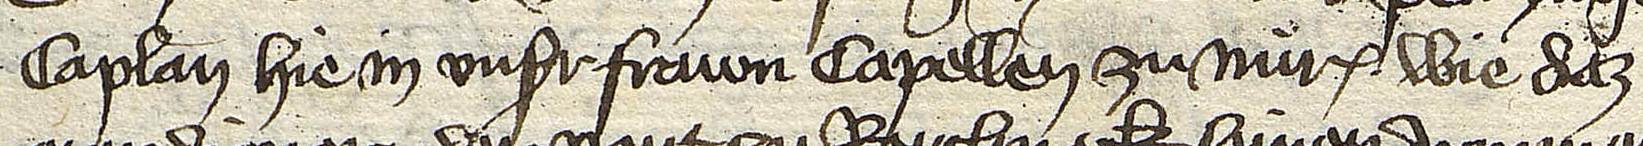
Caplan hie in vnſ*r frawn Capellen cʒu Nür* . wie daʒ
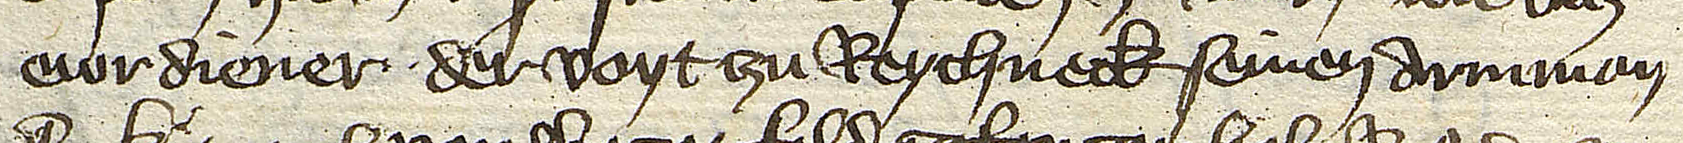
ewr diener . der voyt cʒu Reychneck ſeinen Armman
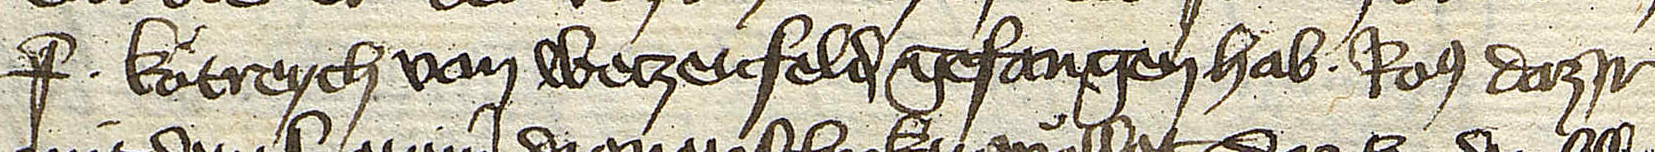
F . kötreych von wecʒenfeld* gefangen hab . Ro* daʒ Ir
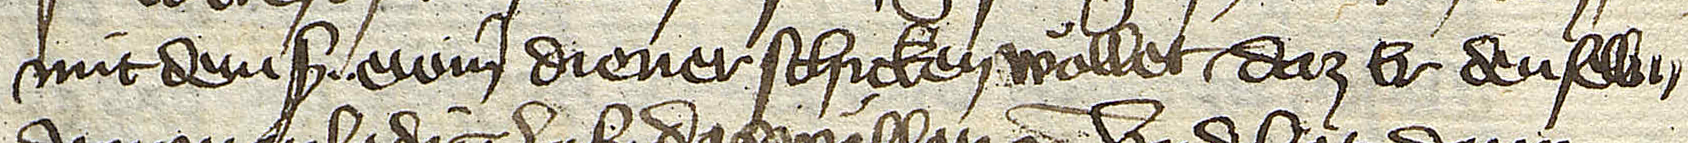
mit demſ* ~ ewm* diener ſchicken wöllet / daʒ Er denſelbn*
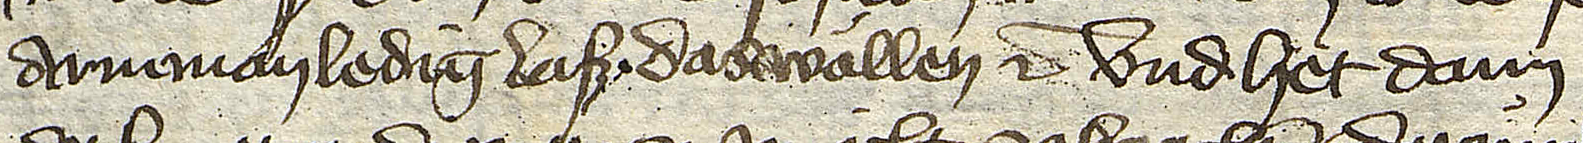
Armman ledig laſʒ . das wöllen ec* Vnd het dann
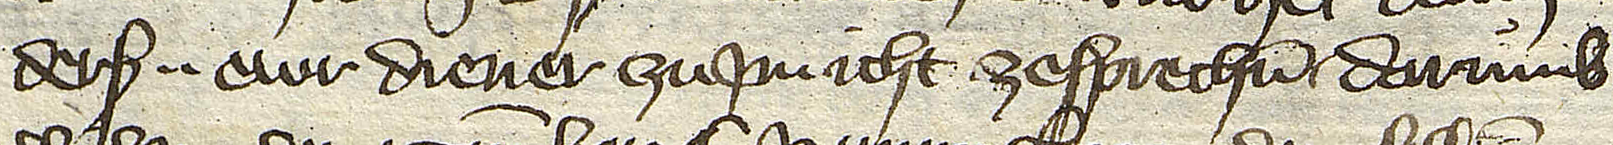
derſ* ~ ewr diener cʒu Im icht cʒeſprechn* / darümb
